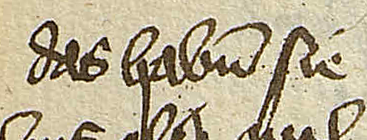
das habn* ſie
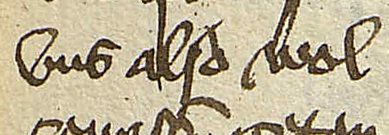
vns alſo wol
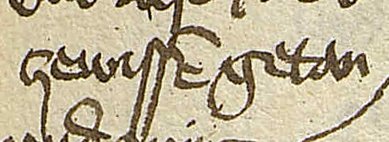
cʒewiſſe* getan
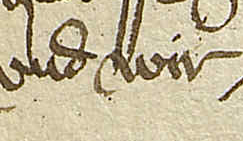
vnd wir
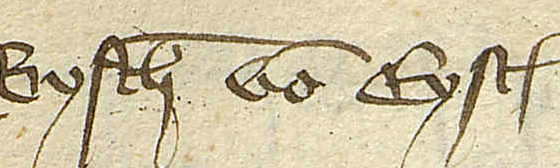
Byſch* vo* Eyſt*
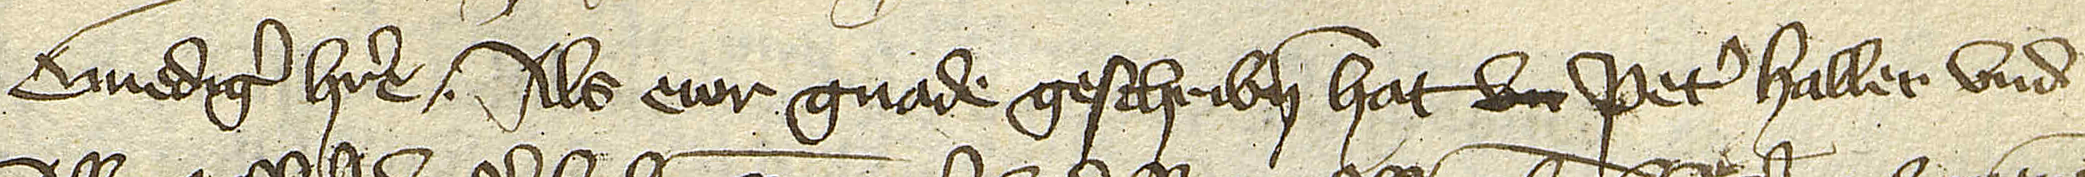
Gnedig* hr*e / . Als ewr gnade geſchribn* hat vn Pet* haller vnd
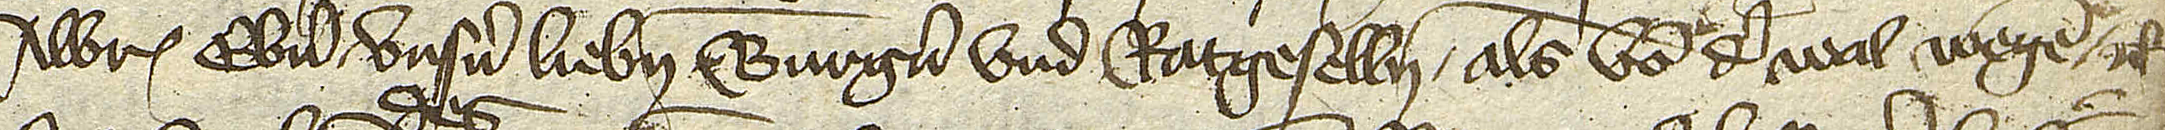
Albr* Ebn* / vnſn* liebn* Burgn* vnd Ratgeſelln* / als vo* d* wal wege* / ec*
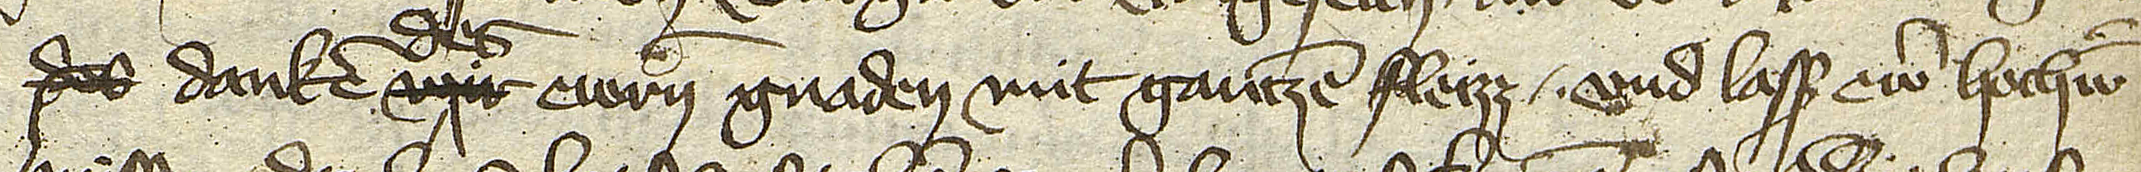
des danke* wir ewrn* gnaden mit gancʒe fleiʒʒ / . vnd laſſ* ew* hochw*
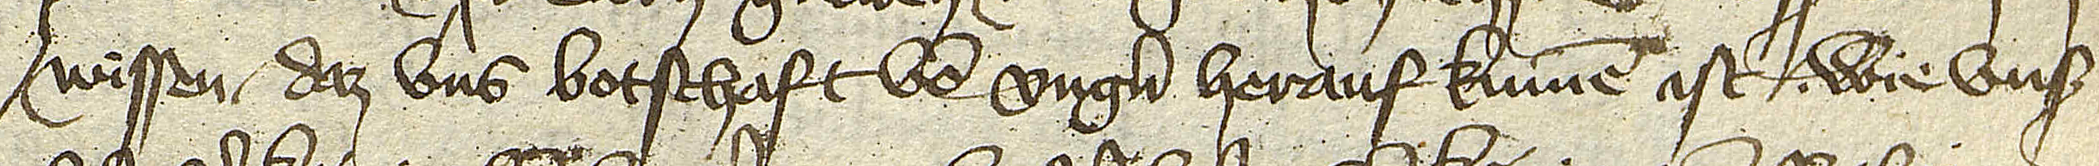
wiſſen / daʒ vns botſchaft vo* vngn* herauf kume* iſt / . wie vnſ*
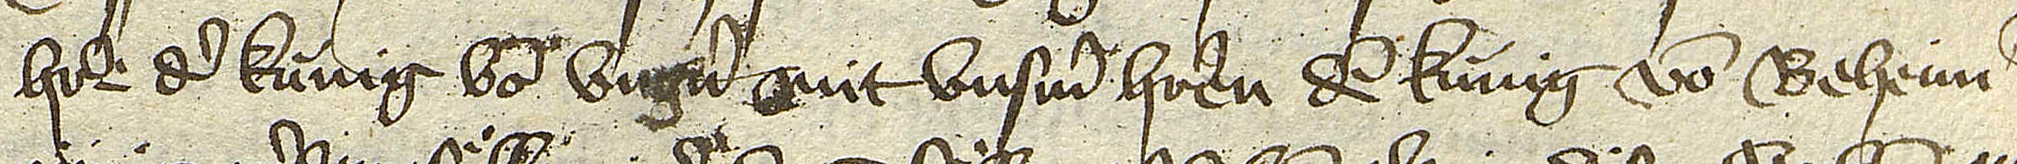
hr*e d* künig vo* vngn* mit vnſm* hr*en d* künig vo* Beheim
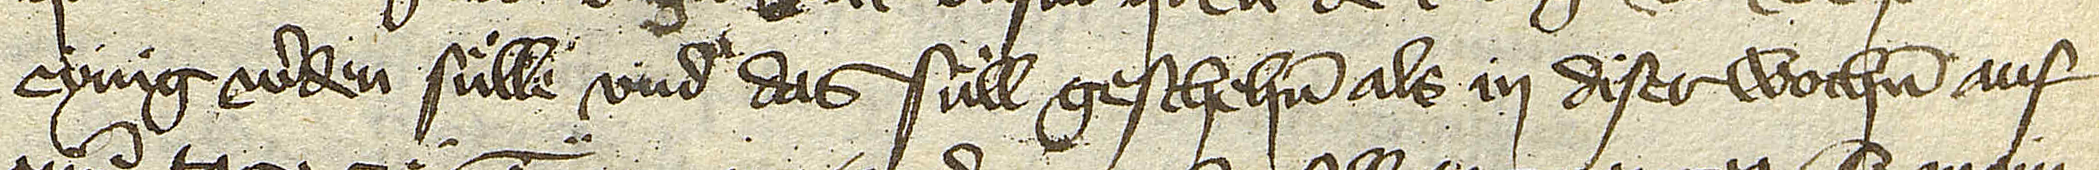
eynig w*den ſülle vnd das ſüll geſchehn* als in diſer wochn* auf
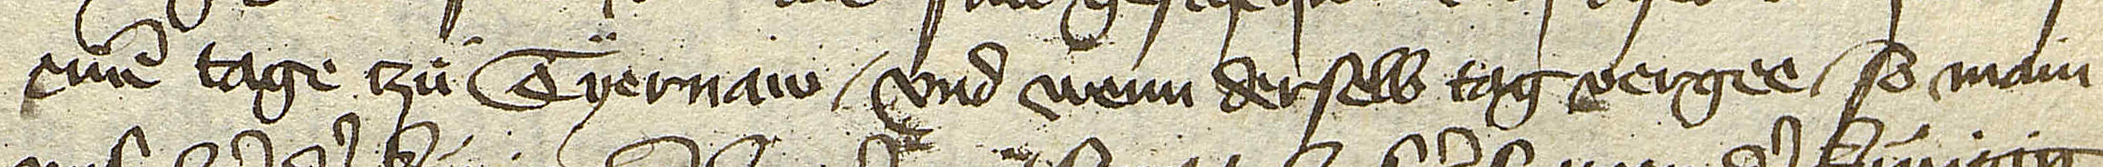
eine* tage cʒü Tyernaw / vnd wenn derſelb tag vergee / ſo main
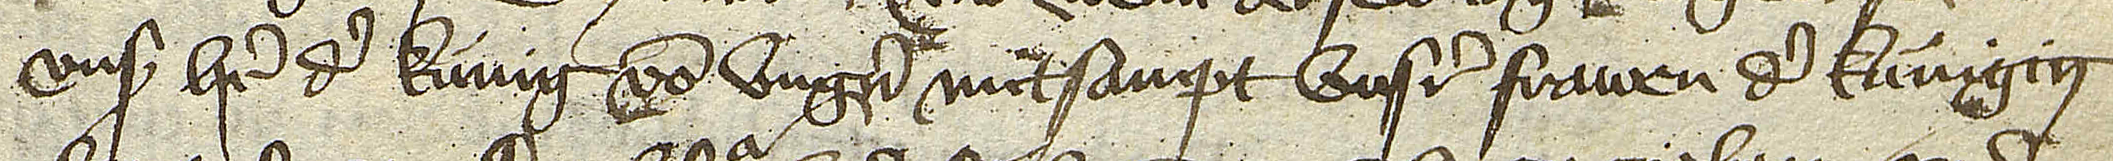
vnſ* hr* d* künig vo* vngn* mitſampt vnſr* frawen d* künigin
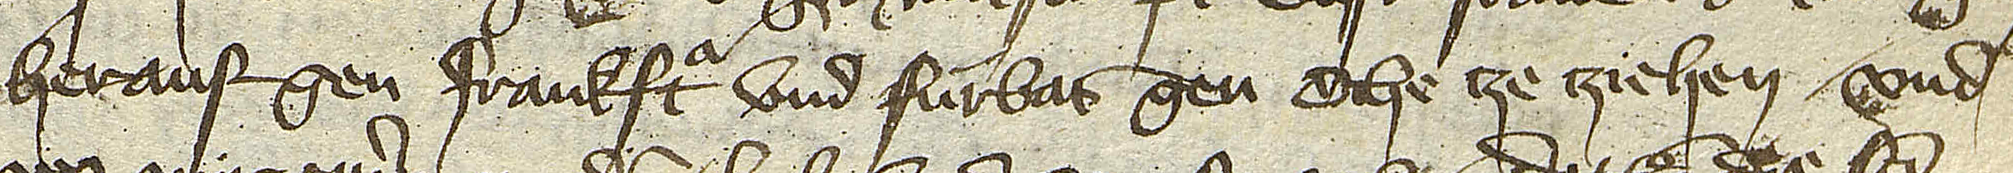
herauf gen Frankft* vnd fürbas gen Oche cʒe cʒiehen / vnd
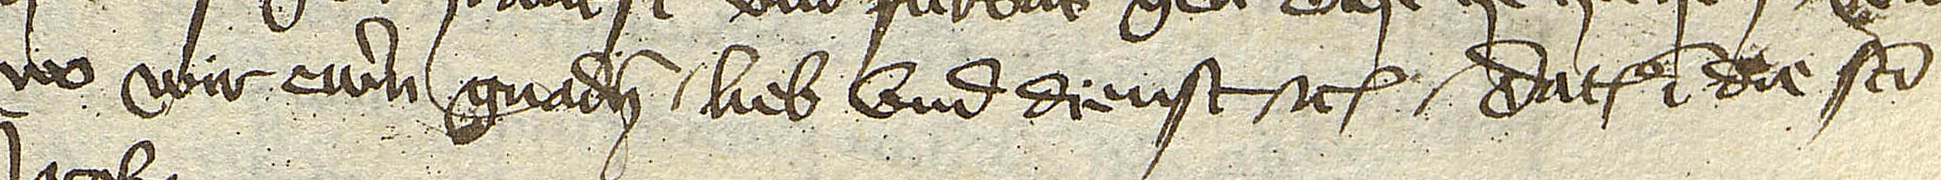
wo wir ew*n gnadn* / lieb vnd dinſt ec* / Dat* i* die ſci*
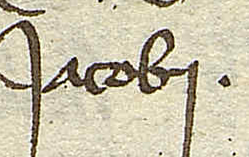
Iacobi .
